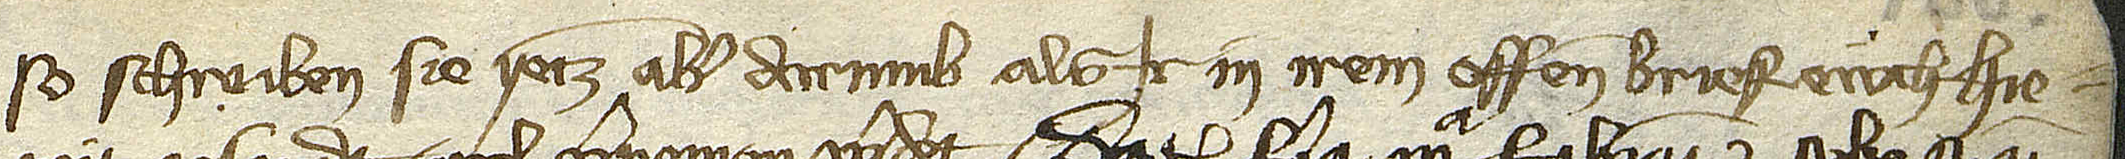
ſo ſchreiben ſie yecʒ* ab* darumb als Ir in irem offen* brief ewch hie =
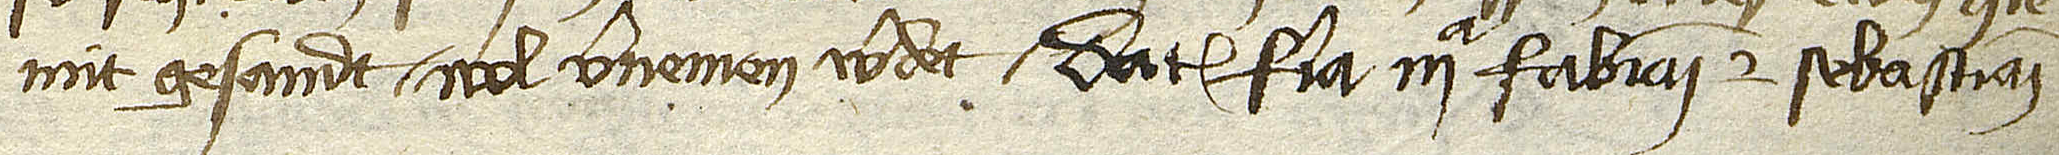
mit geſandt / wol v*nemen w*det . / Dat* fia* iii* fabia*i @ ſebatia*i
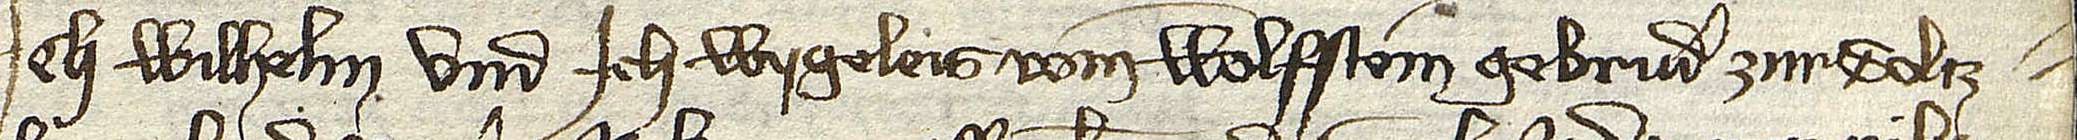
Ich Wilhelm vnd Ich Wygeleis vom* Wolfſtein gebrud* ʒur Salcʒ =
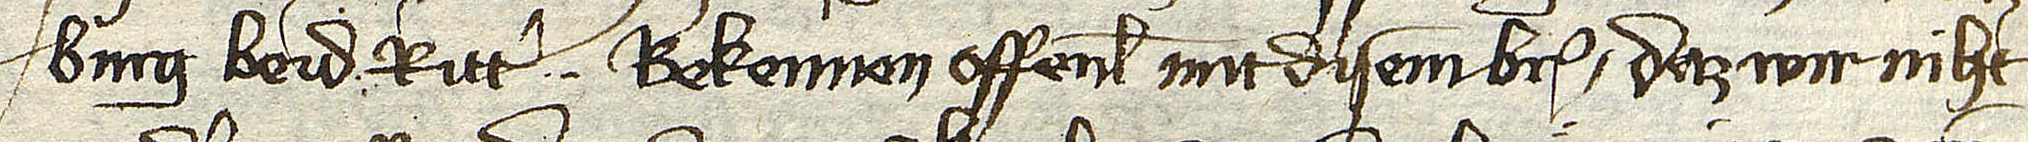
burg beid Ritt* ~ Bekennen offenl* mit diſem br* / daʒ wir niht
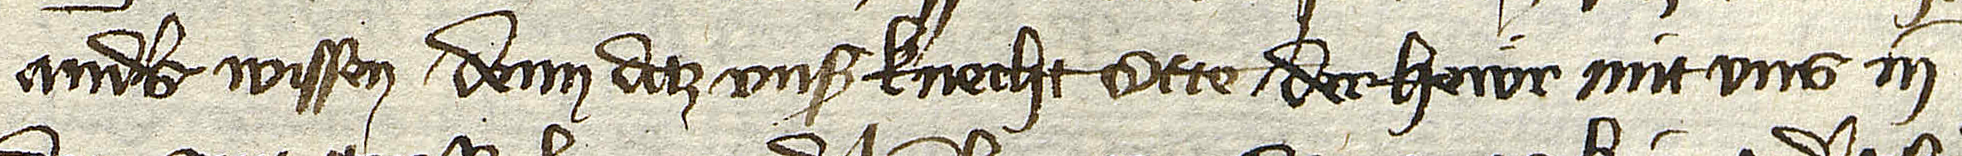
and*s wiſſen / denn daʒ vnſ*r knecht Otte* / der hewr mit vns in
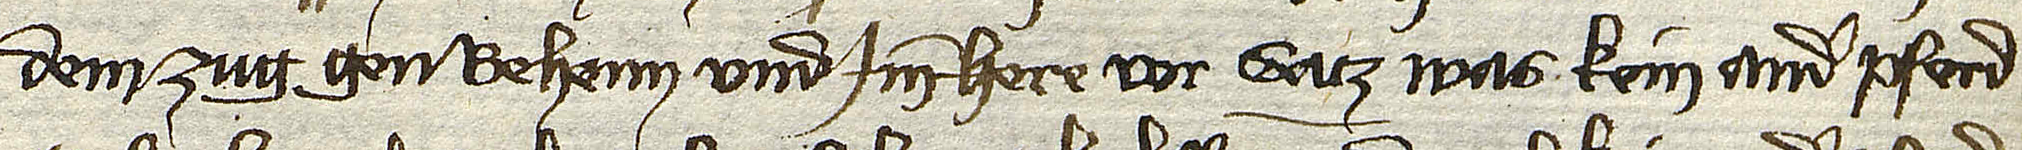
dem ʒug gen Beheim vnd Im* here vor Sacʒ was kein and* pferd
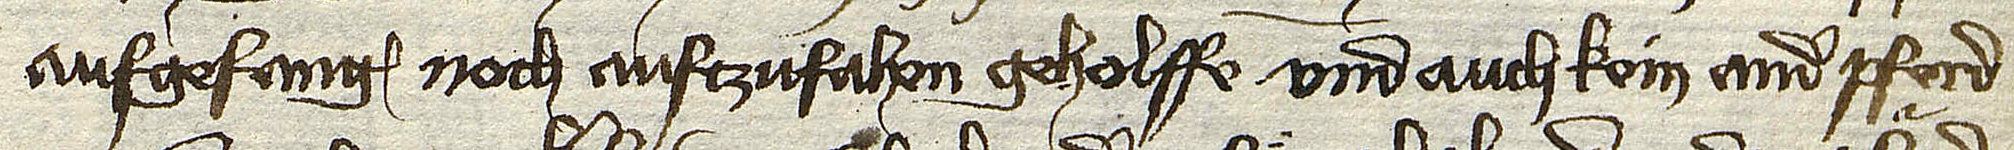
aufgefang* noch aufcʒufahen geholffe* vnd auch kein and* pferd
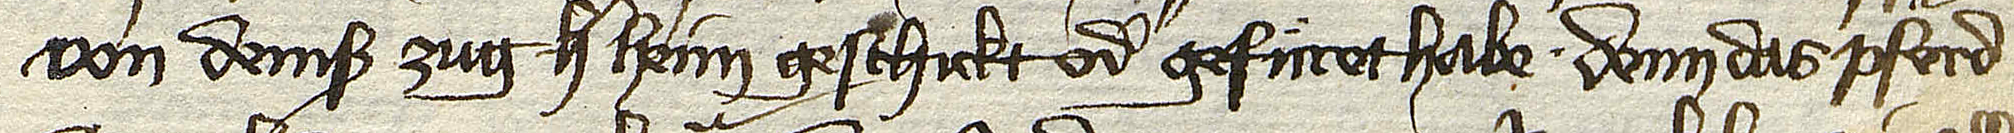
von demſ* ʒug h*heim geſchikt od* gefüret habe . denn das pfërd
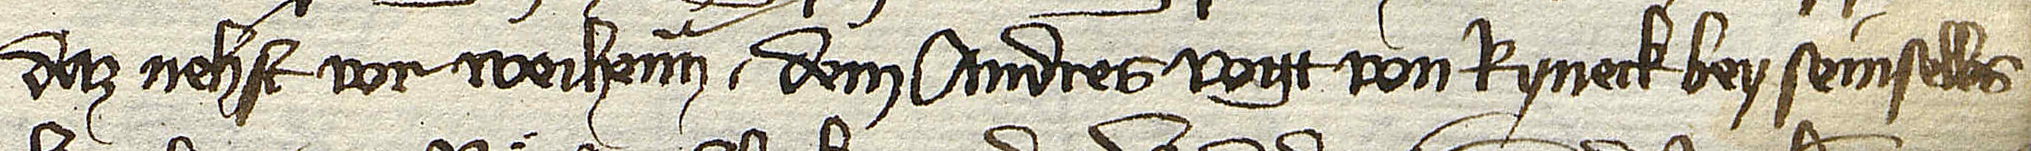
daʒ nehſt vor weiheim* / dem Andres vogt von Ryneck bey ſeinſelbs
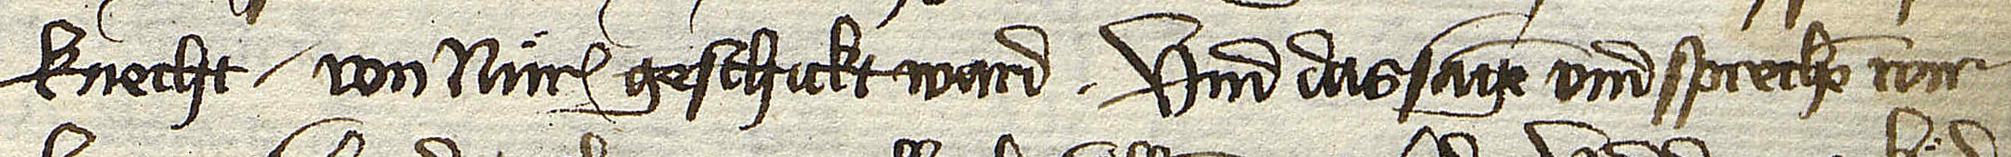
knecht / von Nür* geſchickt ward . Vnd das ſage* vnd ſpreche* wir
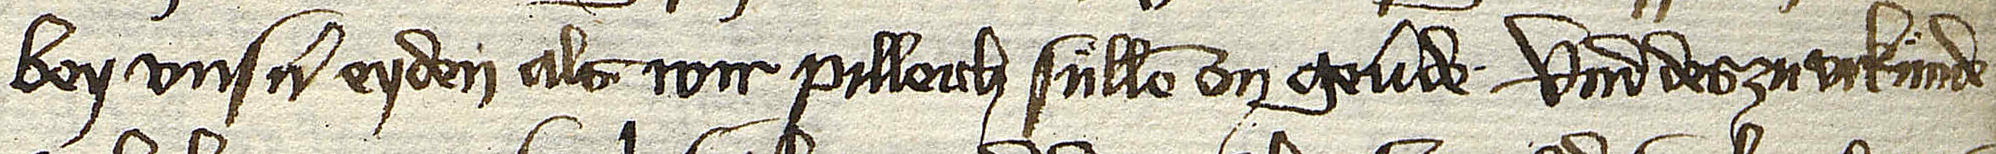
bey vnſ*n eyden als wir pilleich ſülle* on geu*de . Vnd des ʒu v*künde
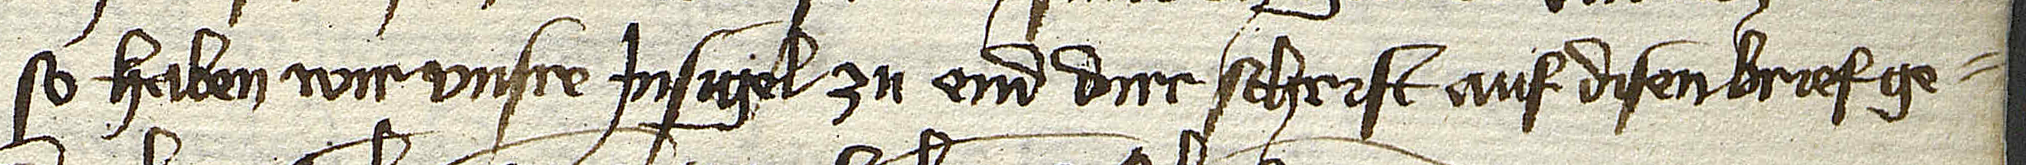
ſo haben wir vnſre Inſigel ʒu end der ſchrift auf diſen brief ge =
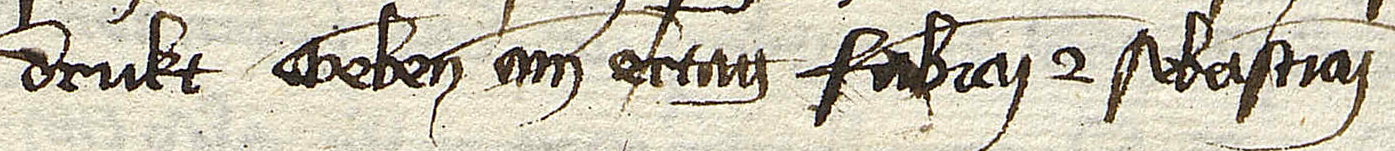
drukt / Geben am* ertag fabia*i @ ſebſtia*i
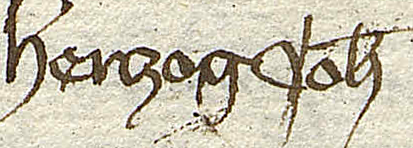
Hercʒog Ioh*
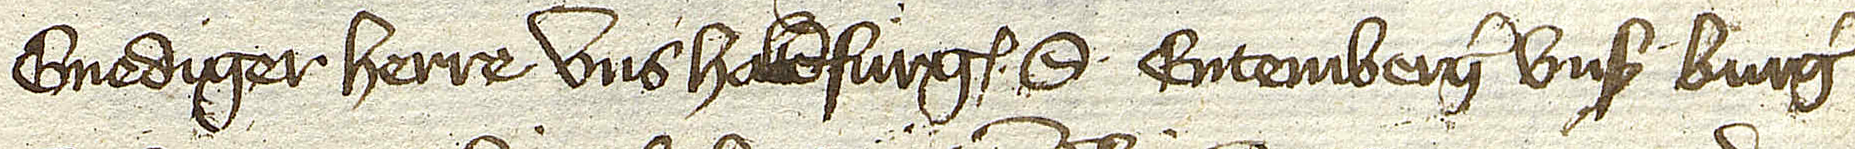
Gnediger herre Vns habe* fürg* . S . Entemberg* vnſ* burg*
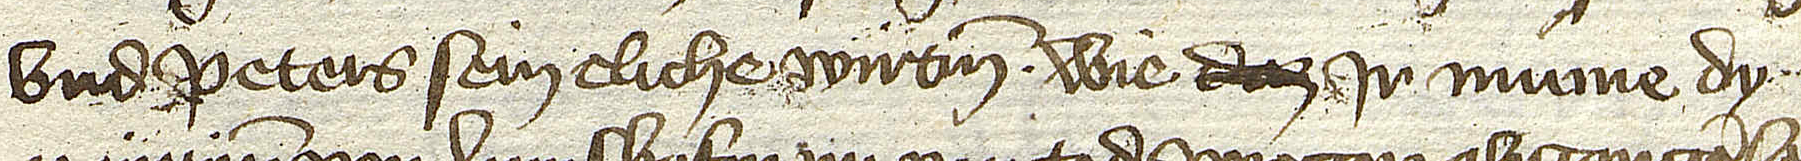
vnd Peters ſein eliche wirtin* . Wie daʒ Ir mume dy
